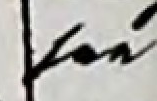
see
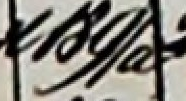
189/a
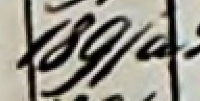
189/a
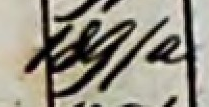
189/a
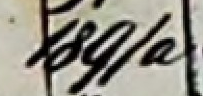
189/a
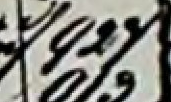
927
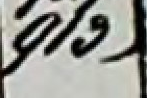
913
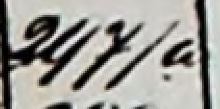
247/a
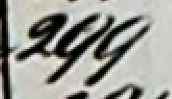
299
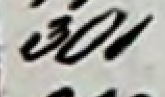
301
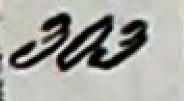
303
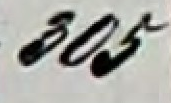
305
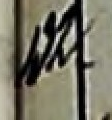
132
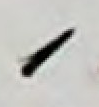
1
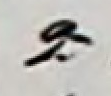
2
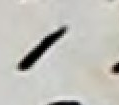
1
